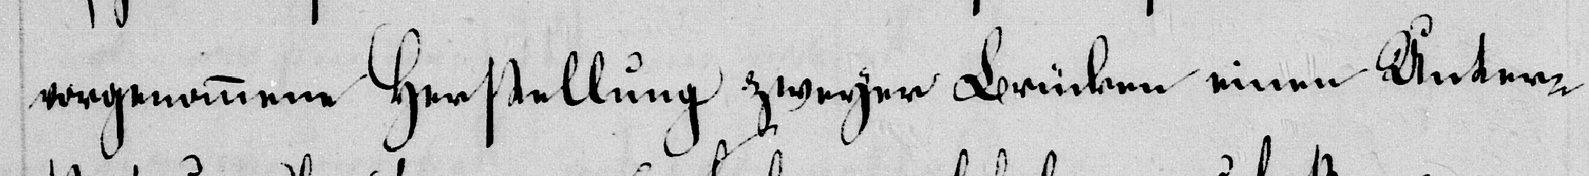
vorgenommene Herstellung zweyer Brücken einen Unter¬
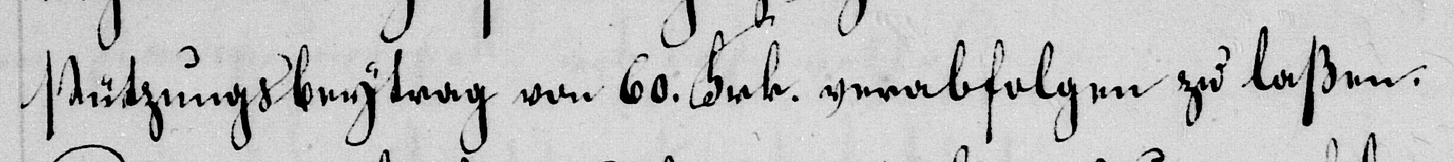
stützungsbeytrag von 60. Frk. verabfolgen zu laßen.
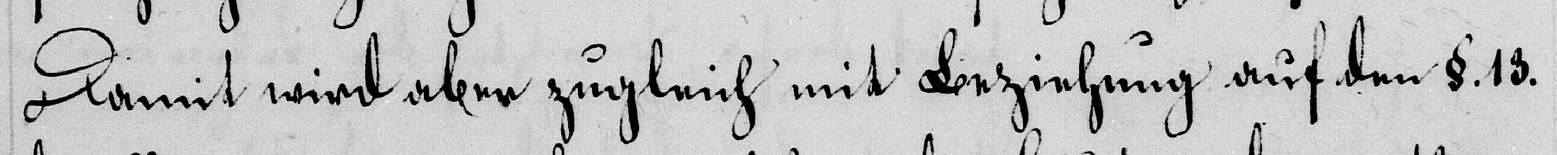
Damit wird aber zugleich mit Beziehung auf den §. 13.
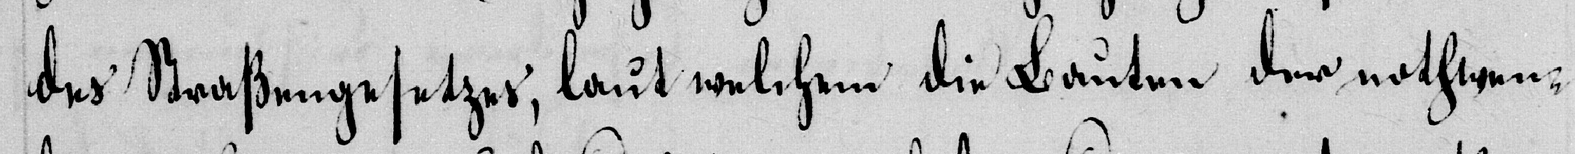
des Straßengesetzes, laut welchem die Bauten der nothwen¬
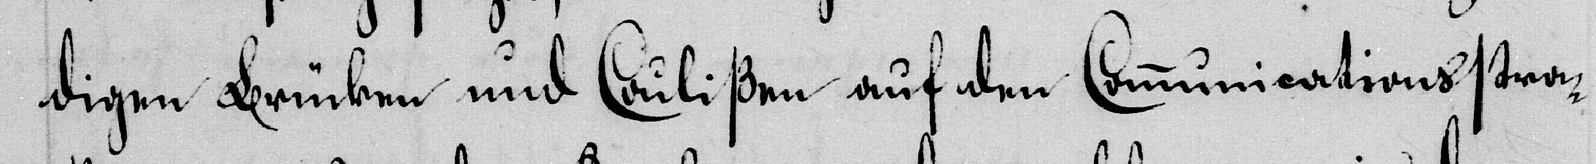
digen Brücken und Coulißen auf den Communicationsstra¬
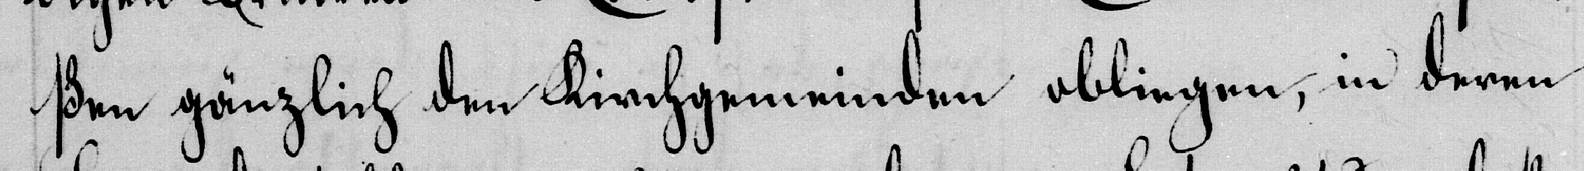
ßen gänzlich den Kirchgemeinden obliegen, in deren
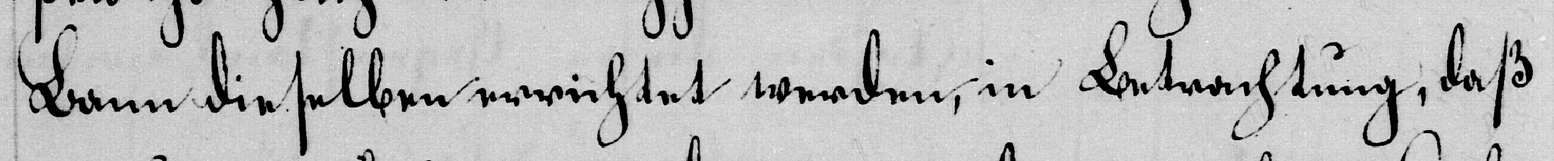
Bann dieselben errichtet werden, in Betrachtung, daß
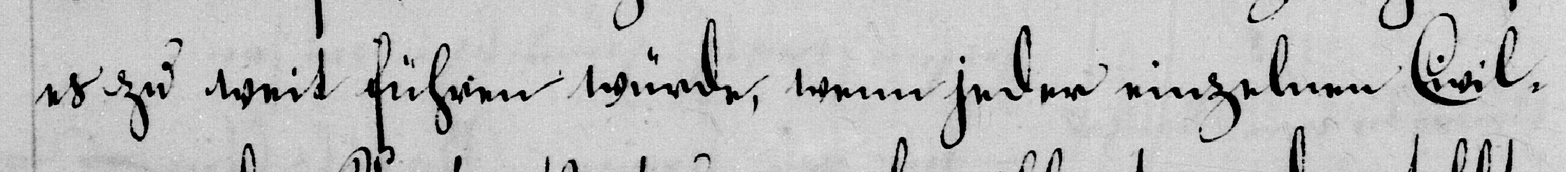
es zu weit führen würde, wenn jeder einzelne Civil¬
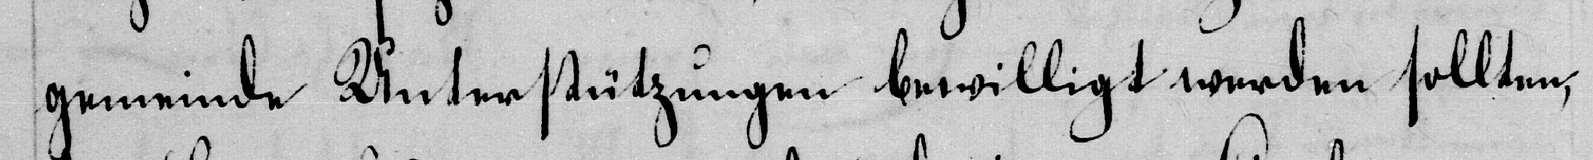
gemeinde Unterstützungen bewilligt werden sollten,
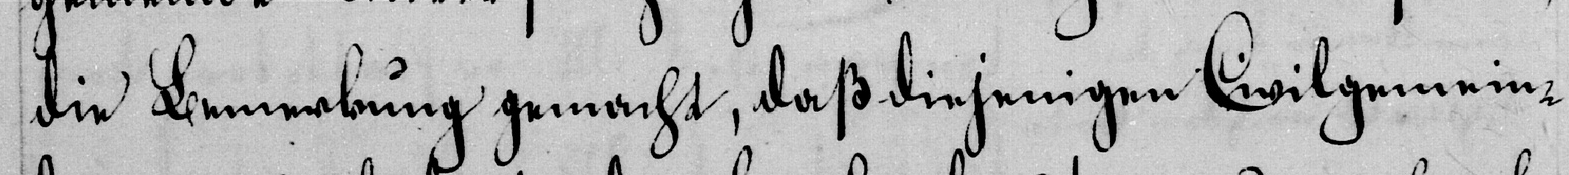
die Bemerkung gemacht, daß diejenigen Civilgemein¬
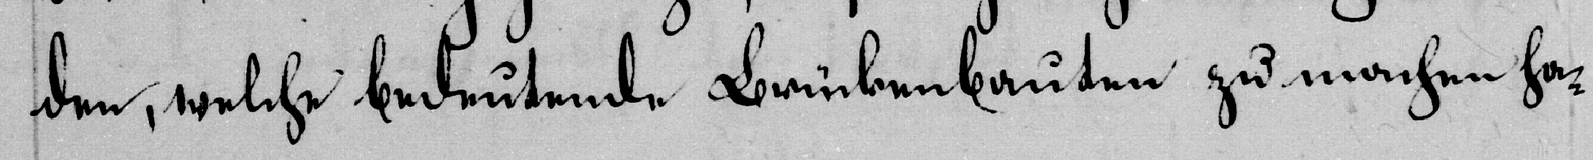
den, welche bedeutende Brückenbauten zu machen ha-
